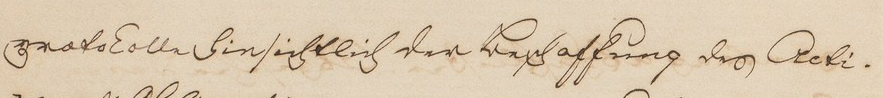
protokolle hinsichtlich der Beschaffung des Acti-
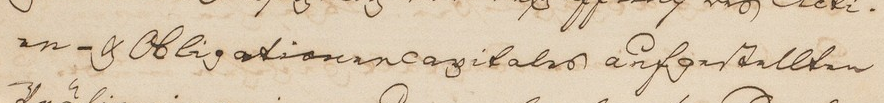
on– & Obligationencapitales aufgestellten
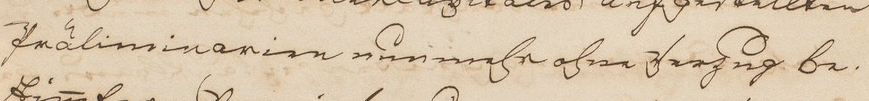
Präliminarien nunmehr ohne Verzug be-
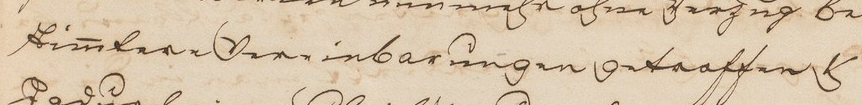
stimmtere Vereinbarungen getroffen &
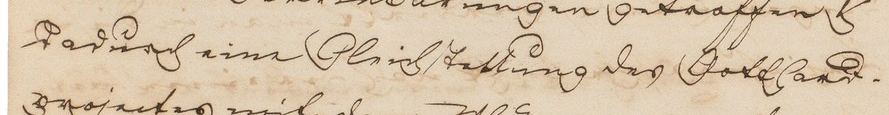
dadurch eine Gleichstellung des Gotthard -
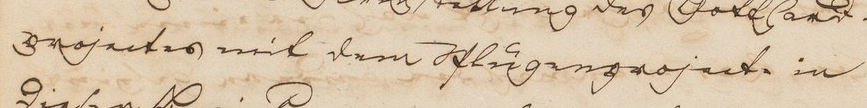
projectes mit dem Splügenprojecte in
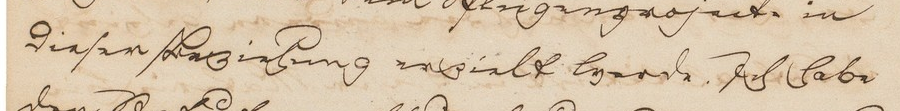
dieser Beziehung erzielt werde. Ich habe
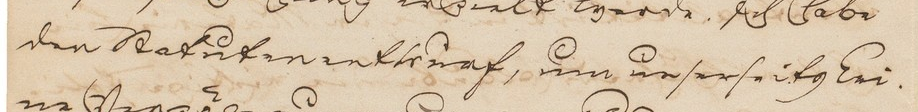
den Statutenentwurf, um unserseits kei-
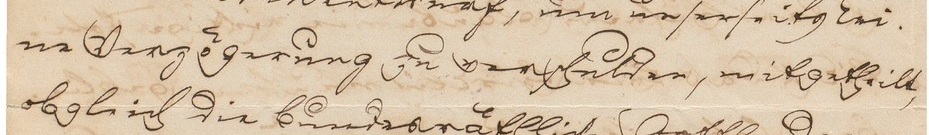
ne Verzögerung zu verschulden, mitgetheilt,
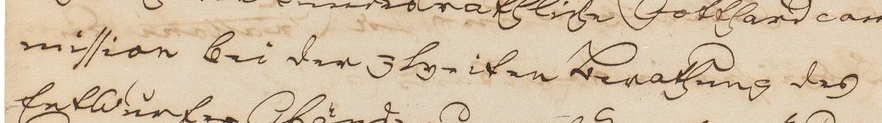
mission bei der zweiten Berathung des
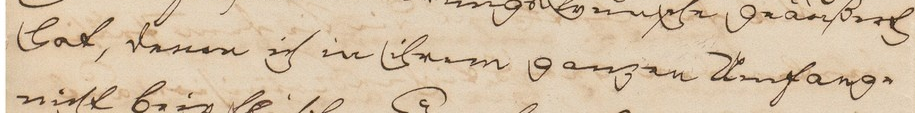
hat, denen ich in ihrem ganzen Umfange
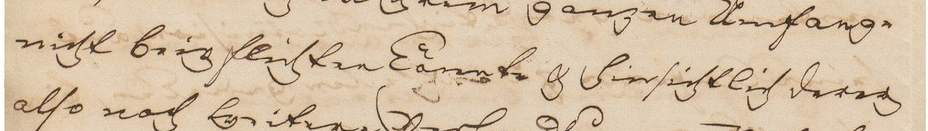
nicht beipflichten könnte & hinsichtlich deren
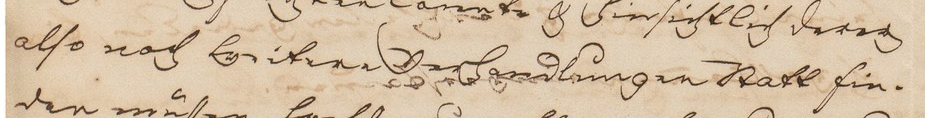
also noch weitere Verhandlungen Statt fin-
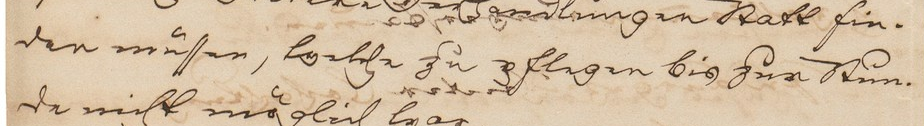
den müssen, welche zu pflegen bis zur Stun-
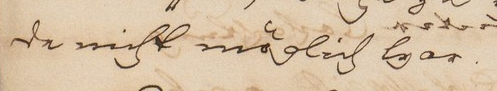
de nicht möglich war.
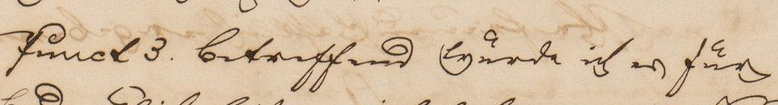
Punct 3. betreffend würde ich es für
